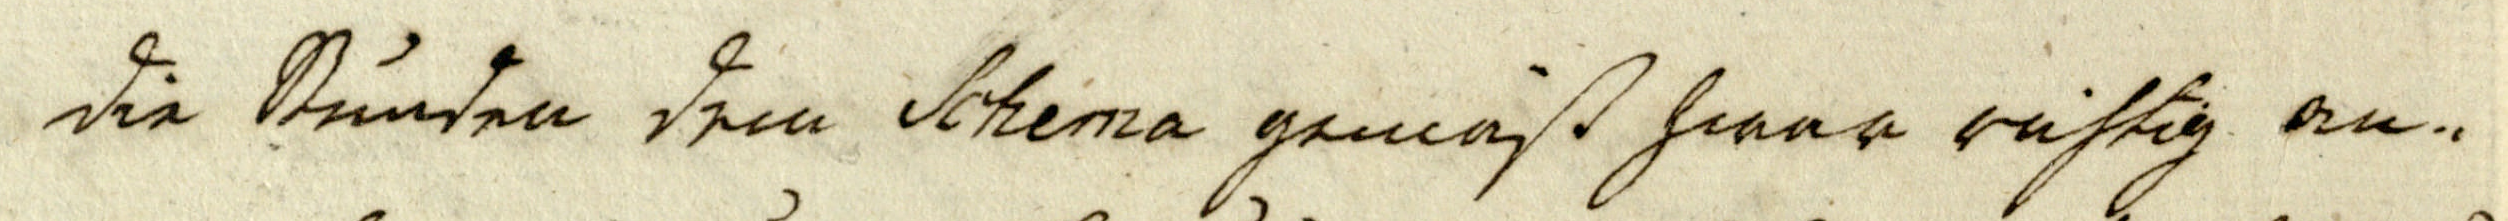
die Stunden dem Schema gemäß zwar richtig an¬
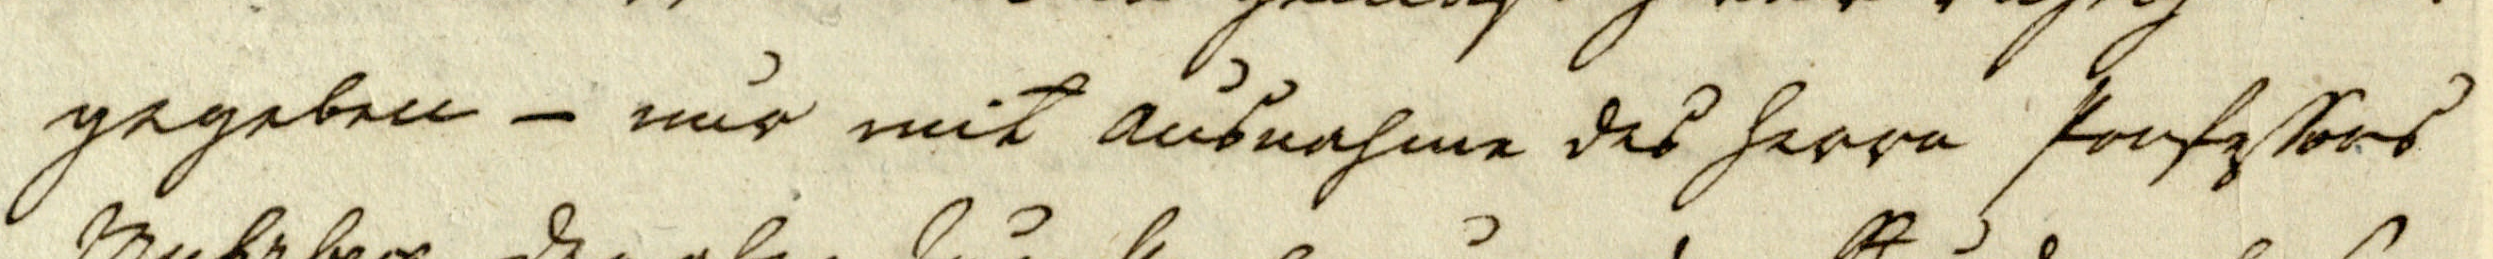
gegeben nur mit Ausnahme des herrn Professors
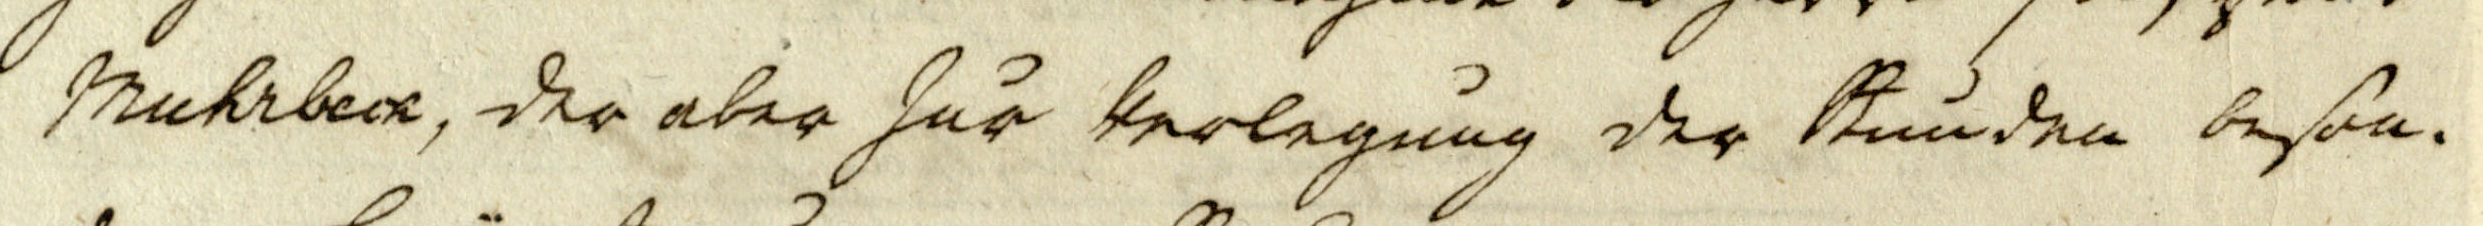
Muhrbeck, der aber zur Verlegung der Stunden beson¬
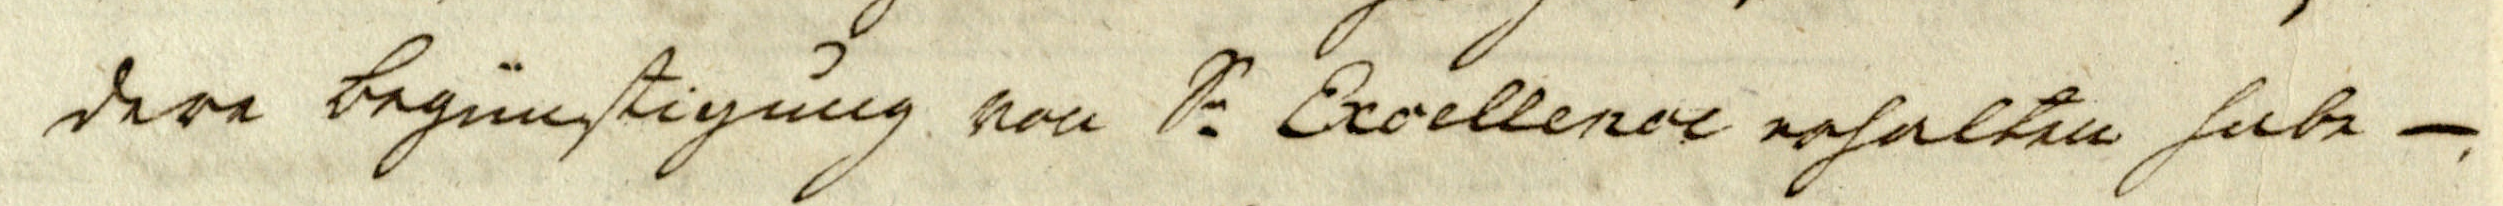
dere Begünstigung von Sr. Excellence erhalten habe,
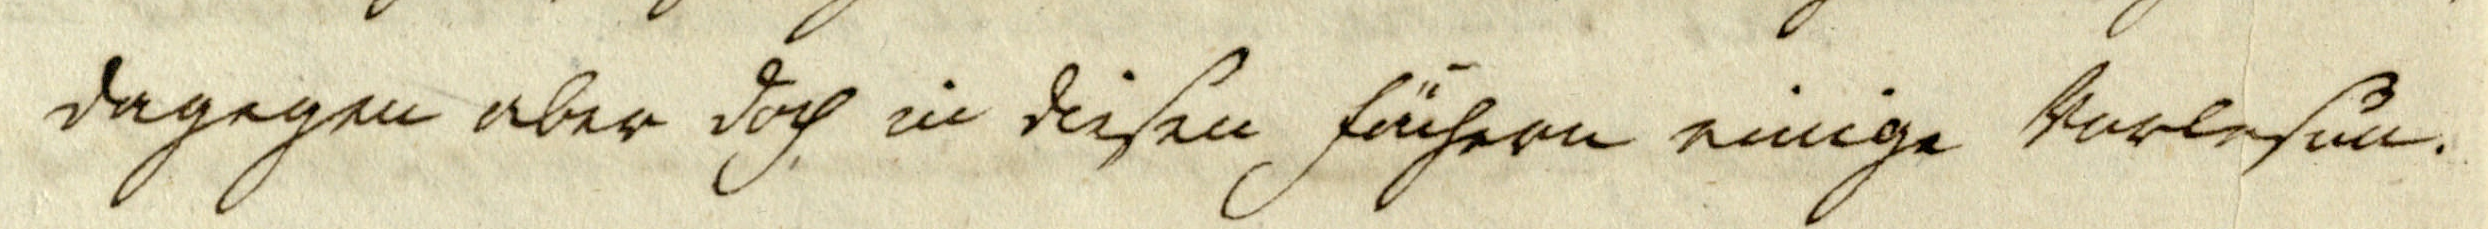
dagegen aber doch in diesen Fächern einige Vorlesun¬
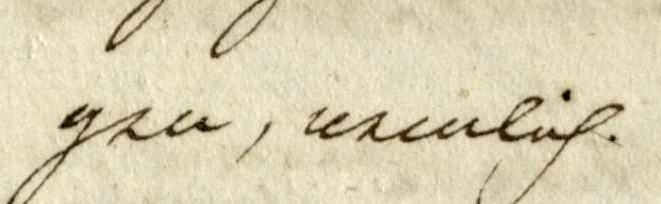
gen nemlich.
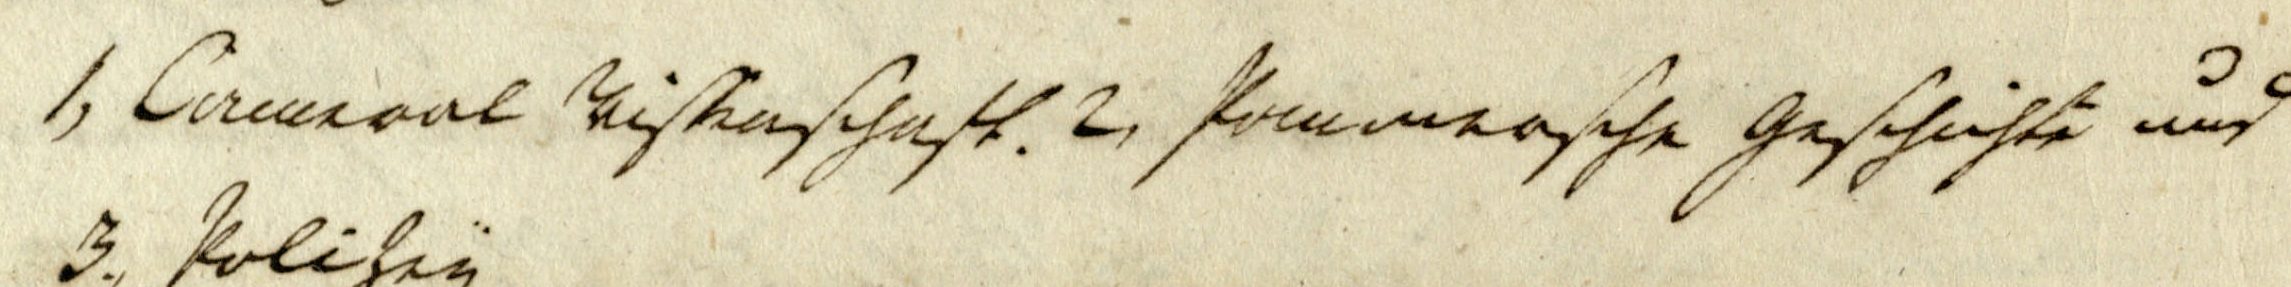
1, Cameral Wissenschaft. 2, Pommersche Geschichte und
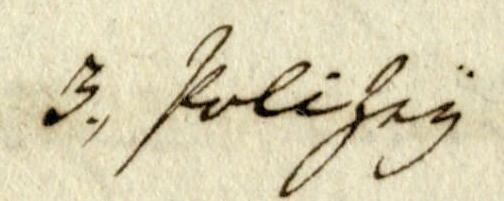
3., Polizeÿ
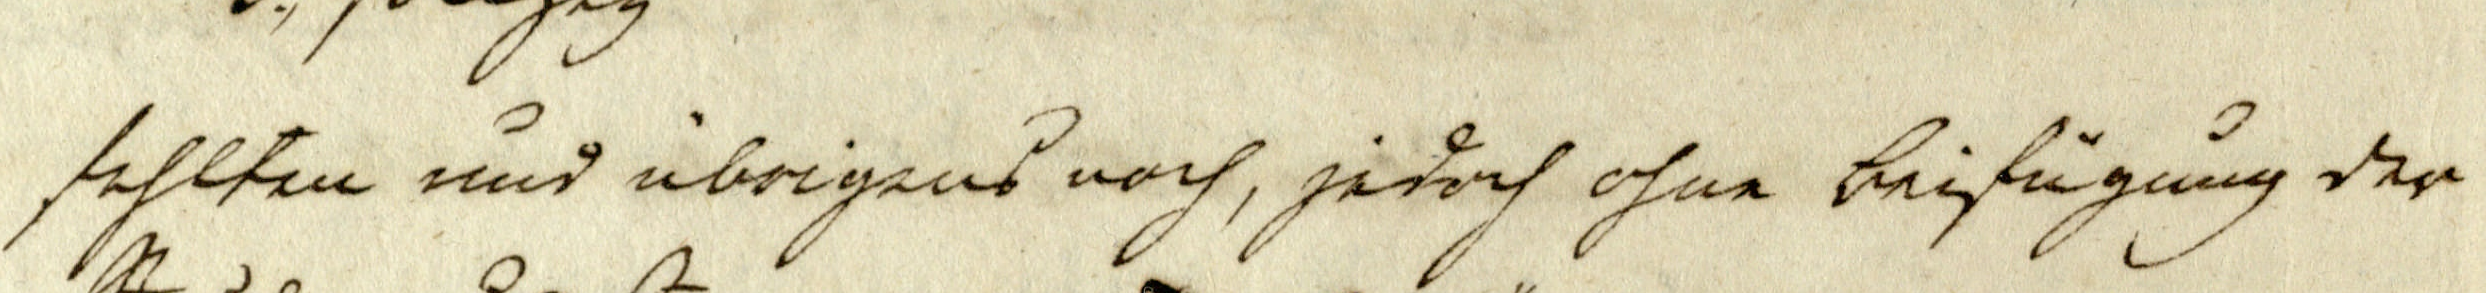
fehlten übrigens noch, jedoch ohne Beifügung der
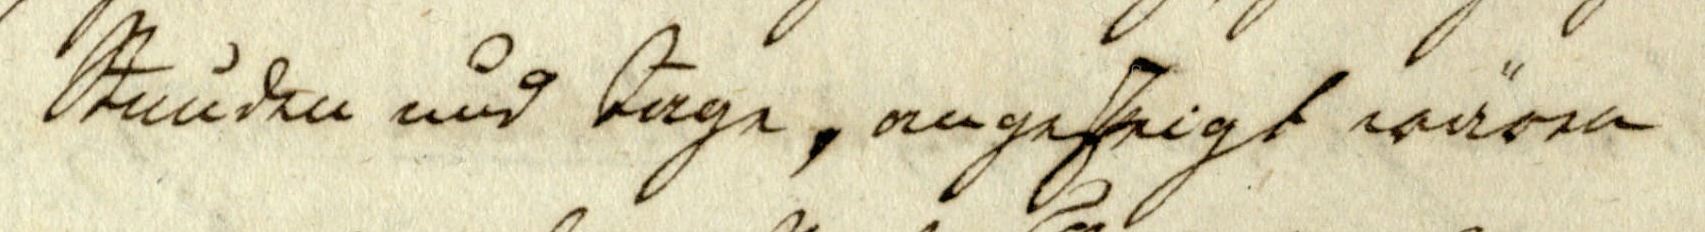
Stunden und Tage, angezeigt wären
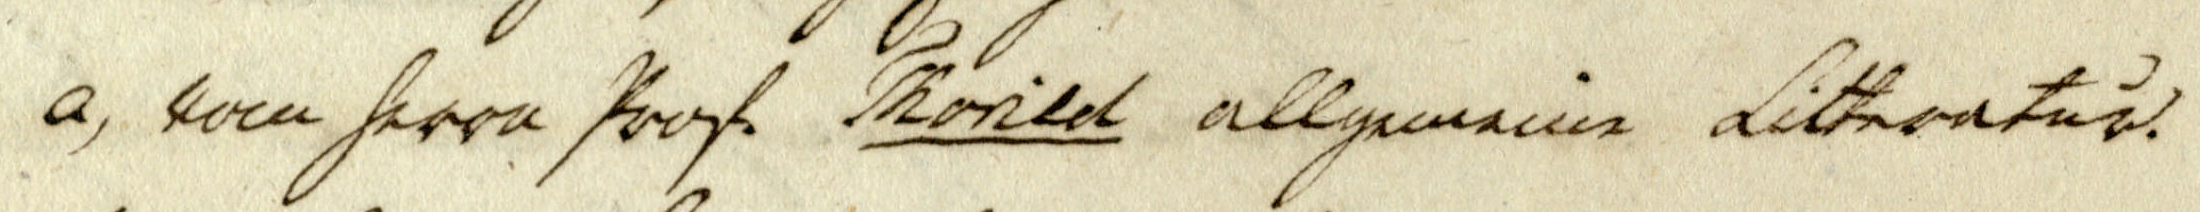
a, vom herrn Prof. Thorild allgemeine Litteratur
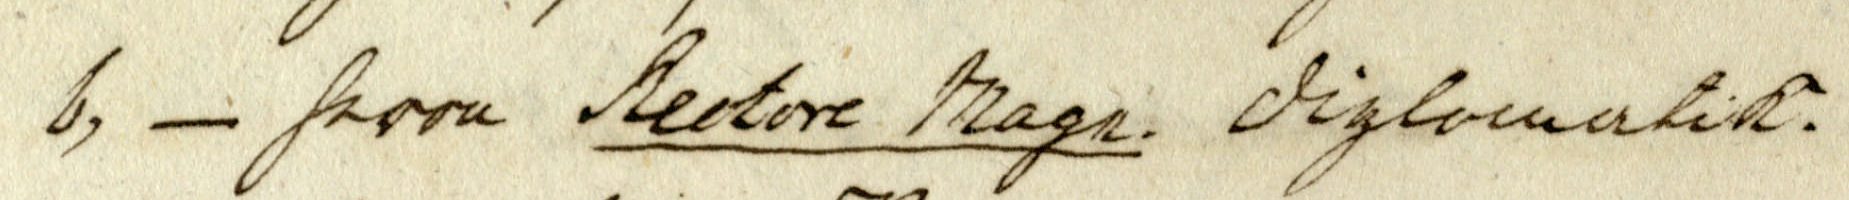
b, herrn Rectore Magn. Diplomatik
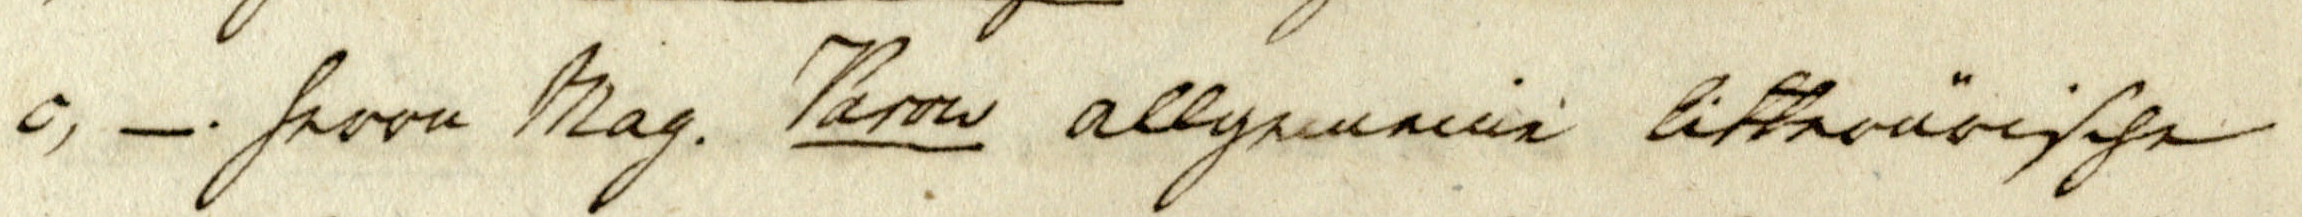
c, herrn Mag. Parow allgemeine litterärische
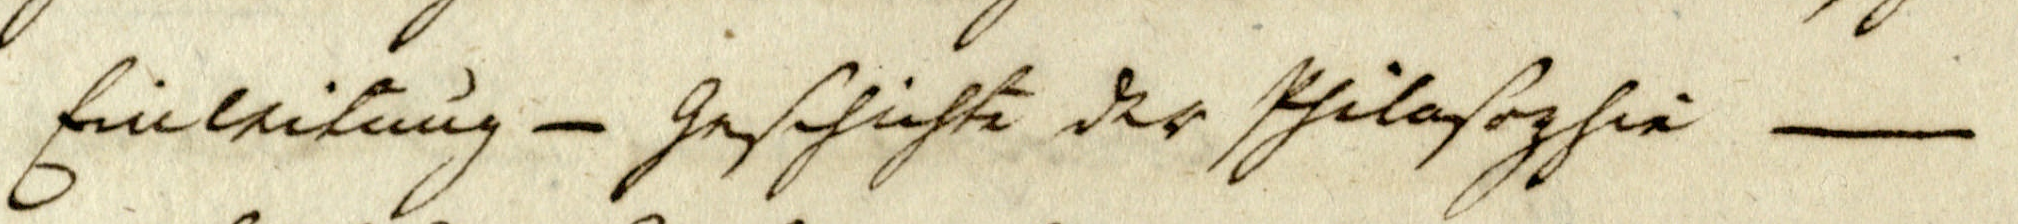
Einleitung Geschichte der Philosophie
